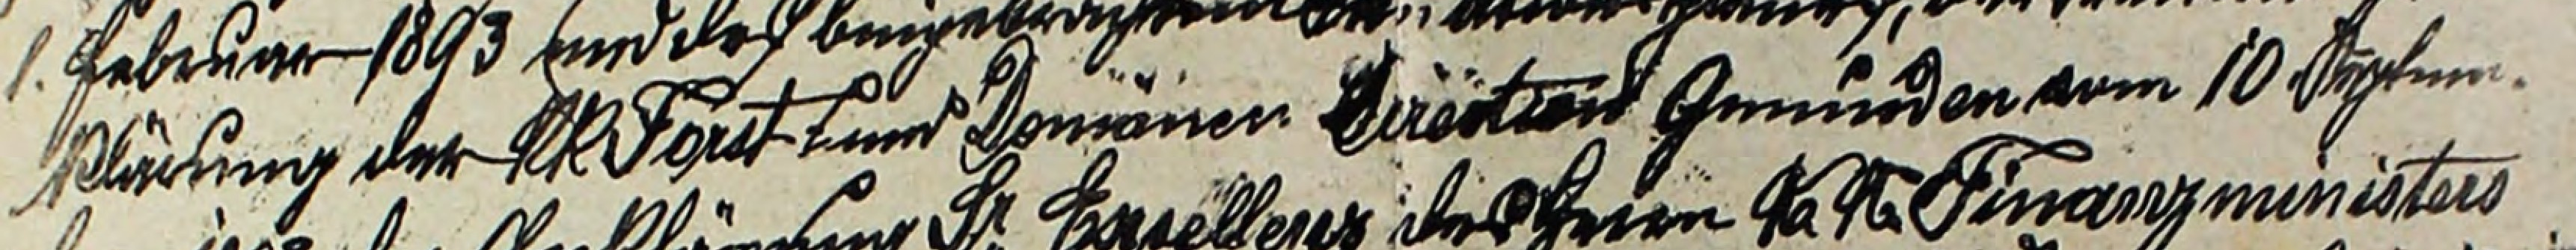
klärung der kk Forst und Domänen Direction Gmunden vom 10. Septem„
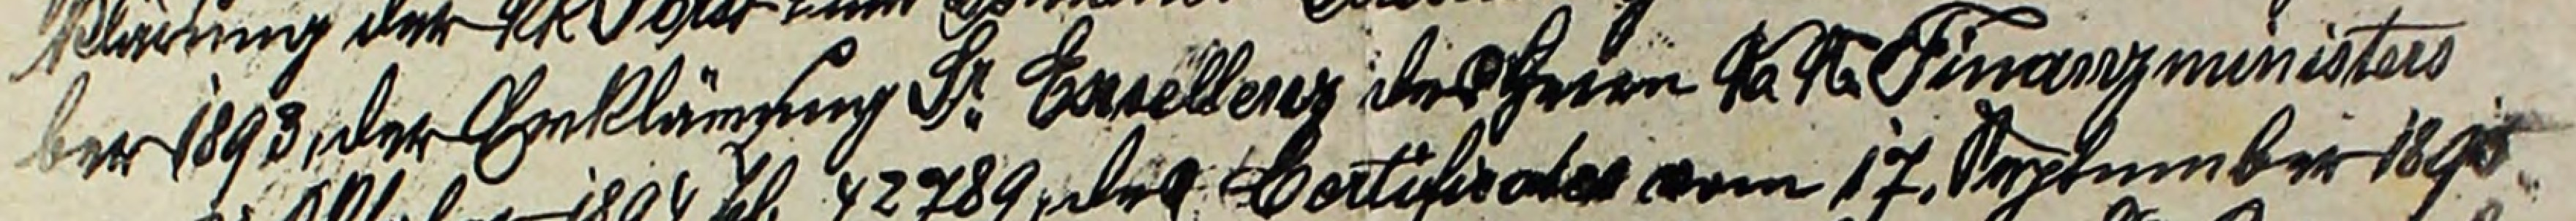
ber 1893, der Erklärung Sr Exsellenz des Herrn k.k. Finanzministers
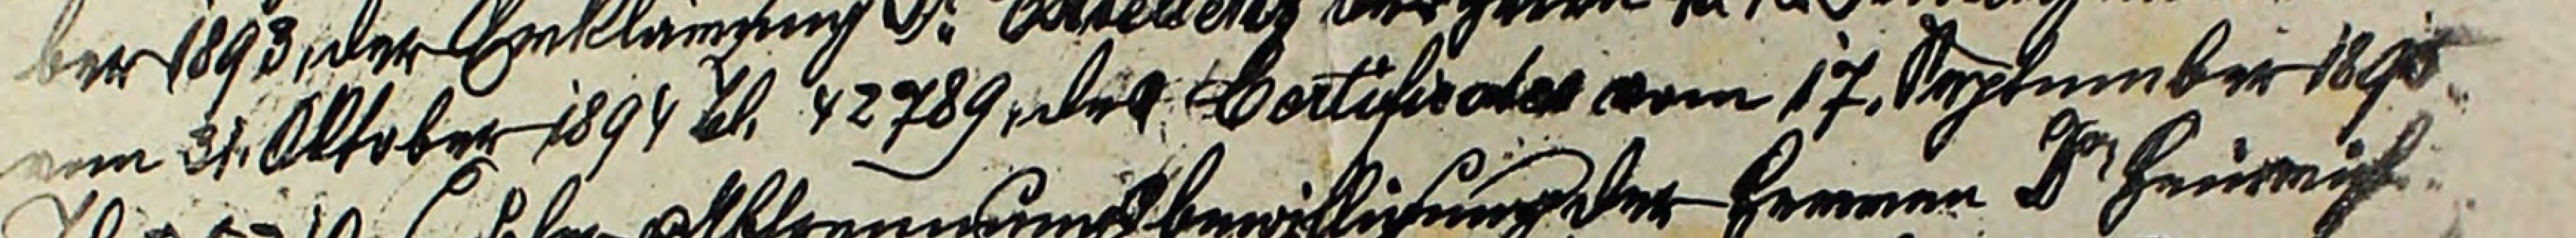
vom 31. Oktober 1894 Bl. 42789, des Certificates vom 17. September 1895
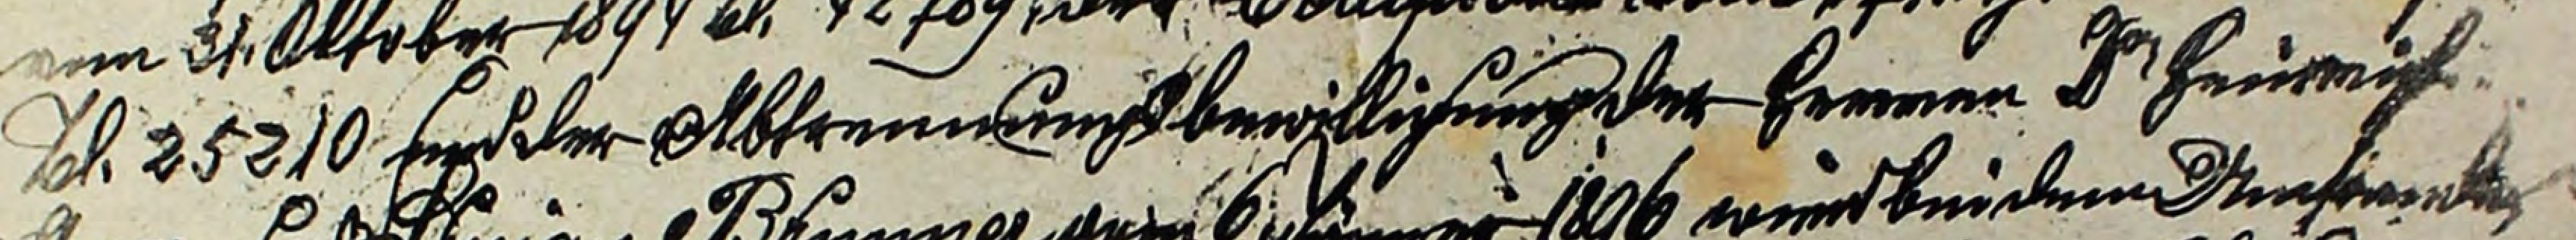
Bl. 25210 und der Abtrennungsbewilligung der Hemmen Dr Heinrich
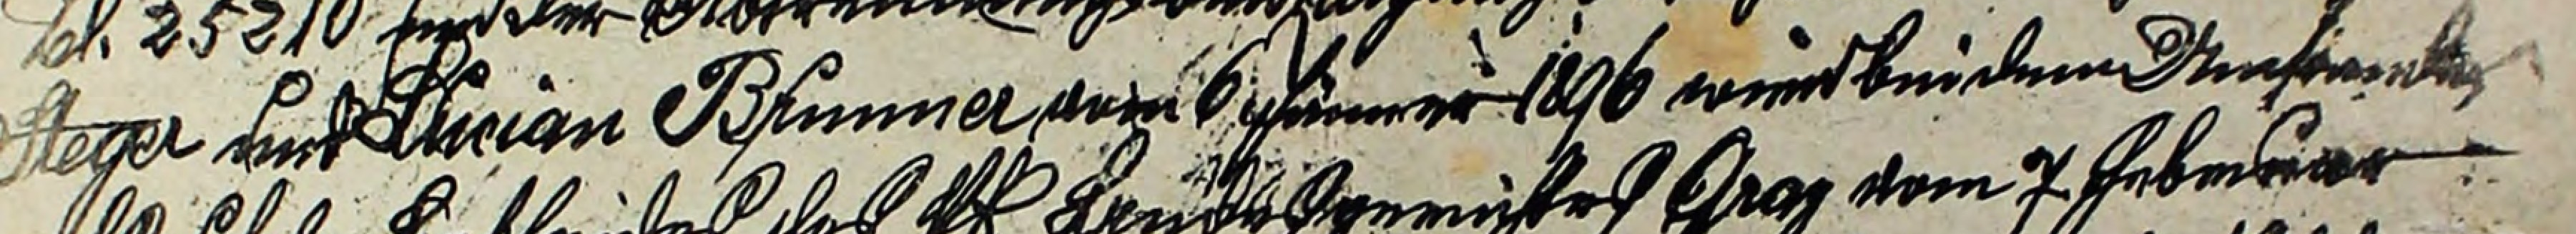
Steger und Lucian Brunner vom 6. Jänner 1896 würd bei dem Ums???
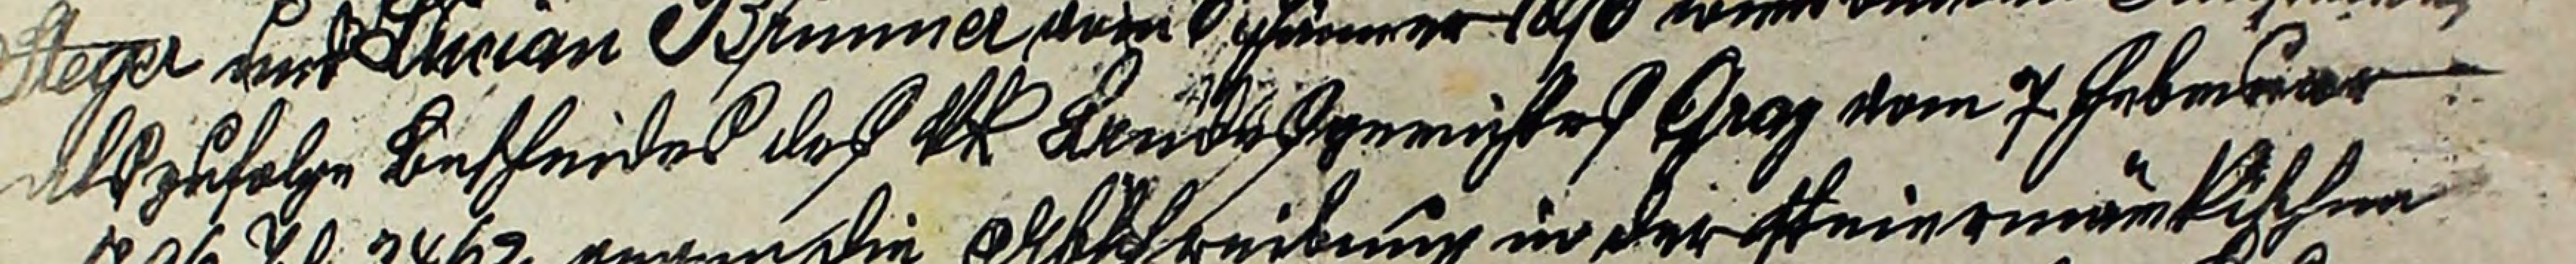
alszufolge Bescheides des kk Landesgerichtes Graz vom 7. Februar
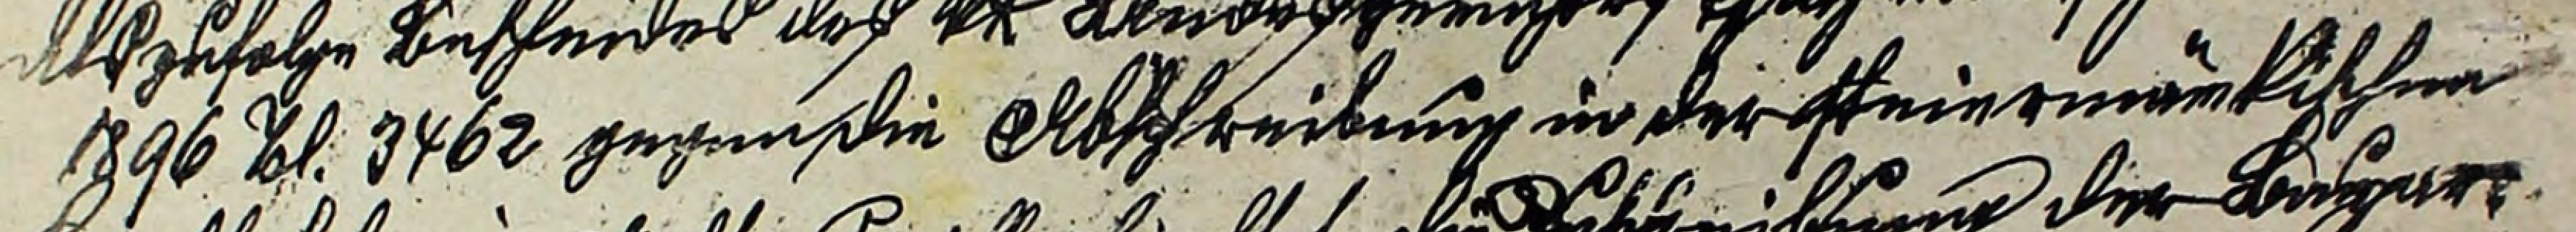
1896 Bl. 3462 gegen die Abschreibung in der steiermämkischen
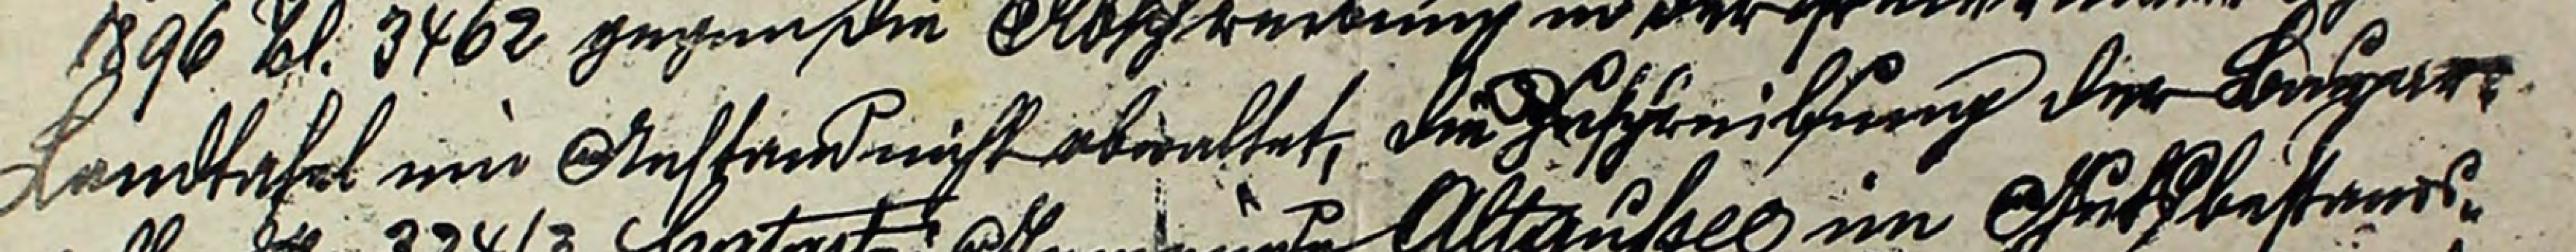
Landtafel ein Anstandnicht obwaltet, die Zuschreibung der Baupar„
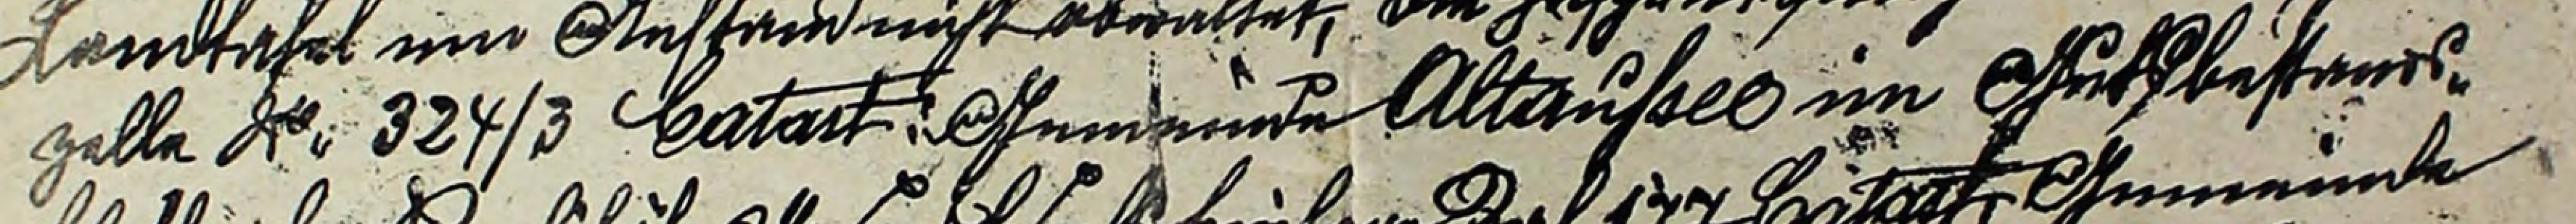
zelle No 324/3 Catast: Gemeinde Altaussee im Gutsbestands„
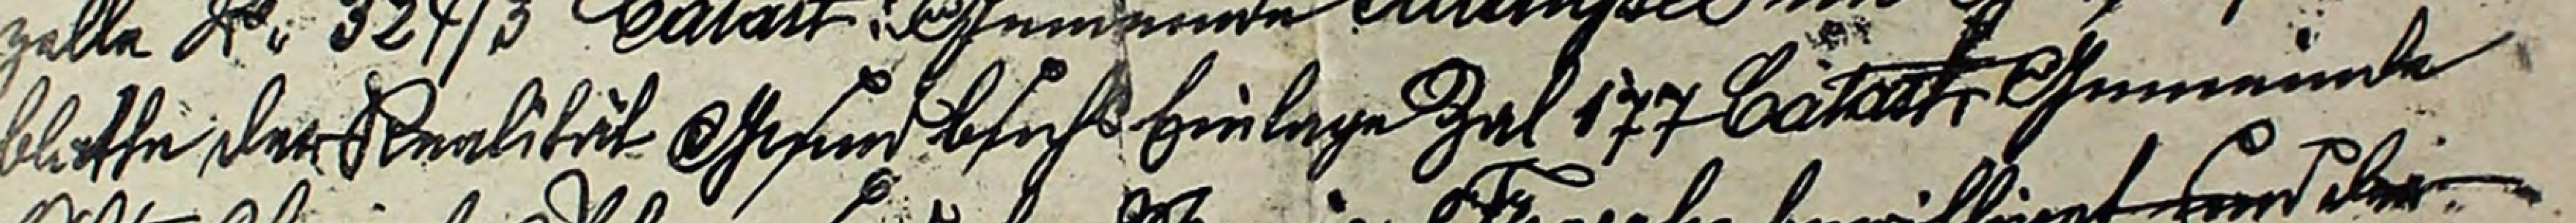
blasse der Realität Grund Buchs Einlage Zal 177 Catastr Gemeinde
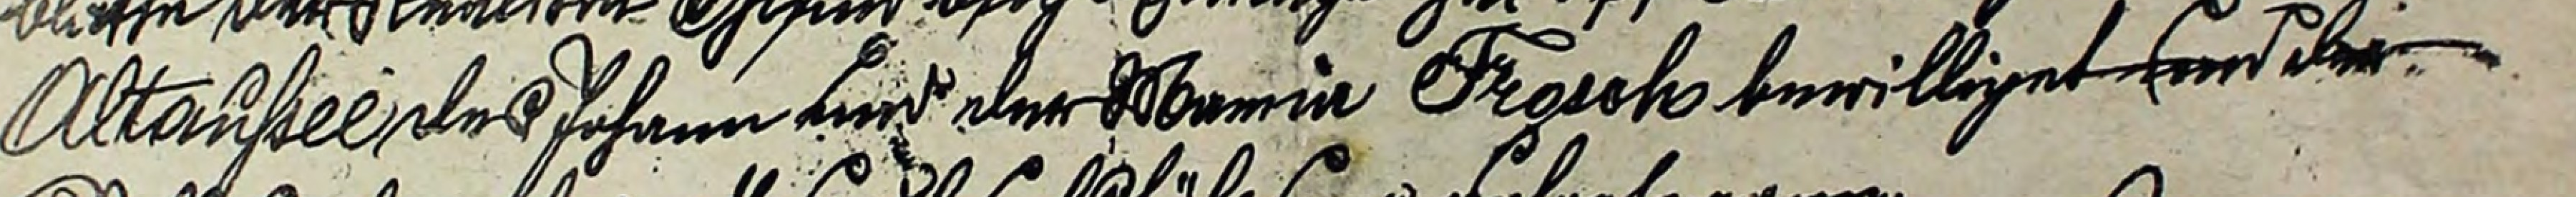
Altaussee des Johann und der Maria Frosch bewilliget und der
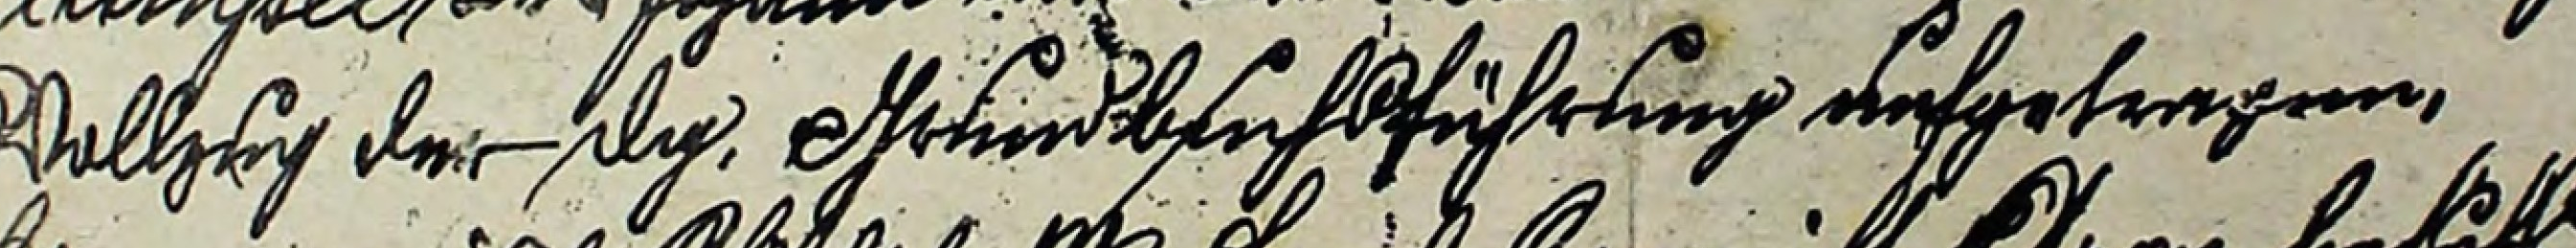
Vollzug der dg. Grundbuchsführung aufgetragen,
